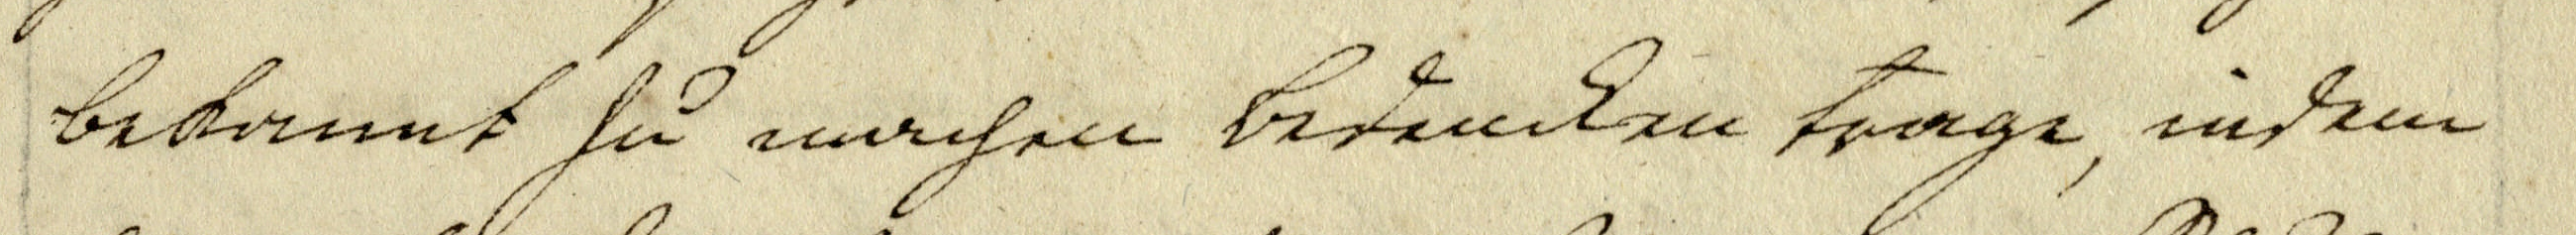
bekannt zu machen Bedencken trage, indem
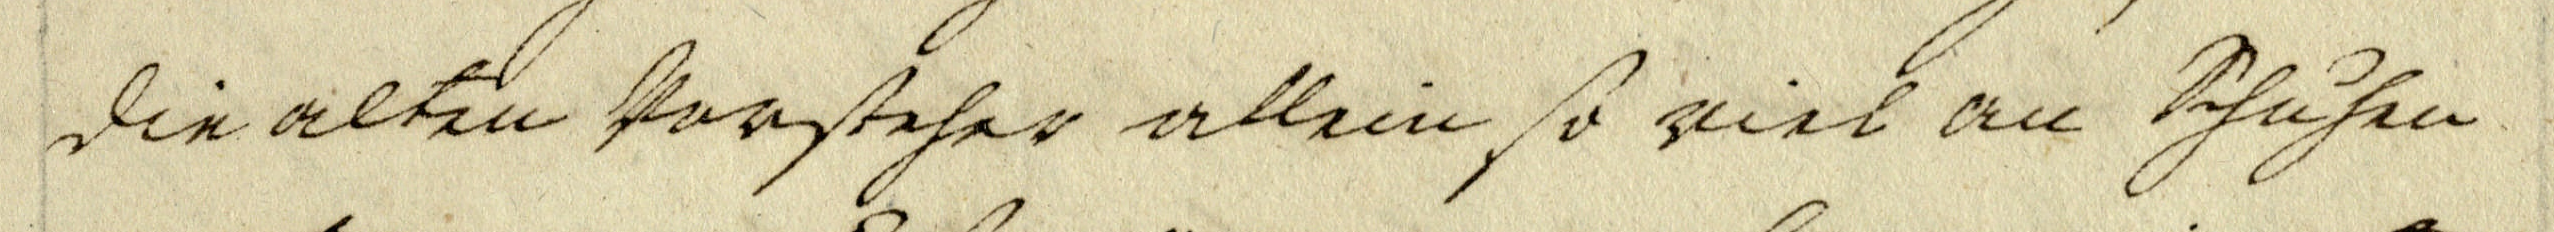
die alten Vorsteher allein so viel an Schuhen
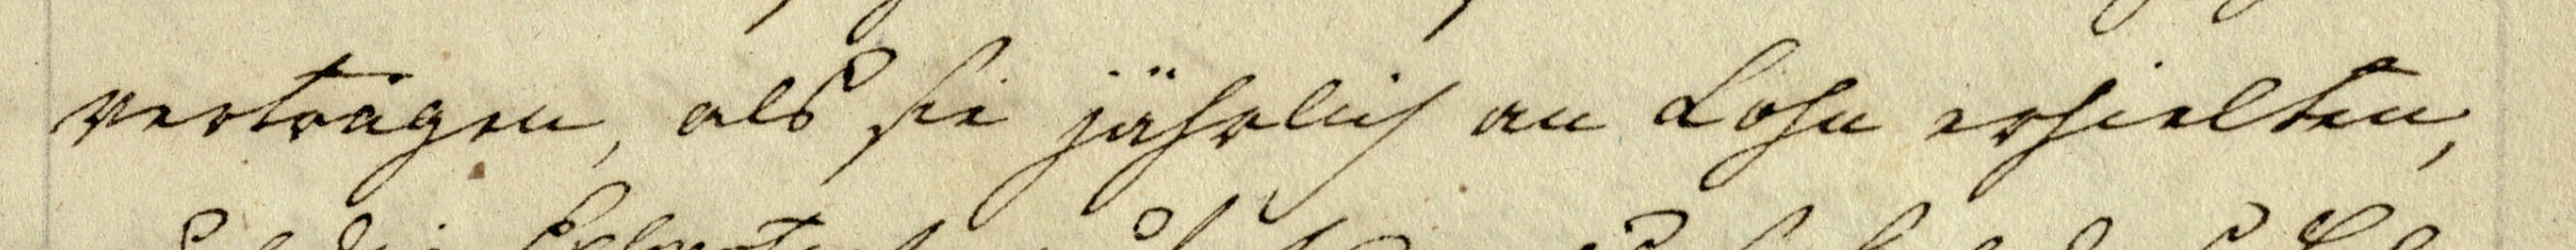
verträgen, als sie jährlich an Lohn erhielten,
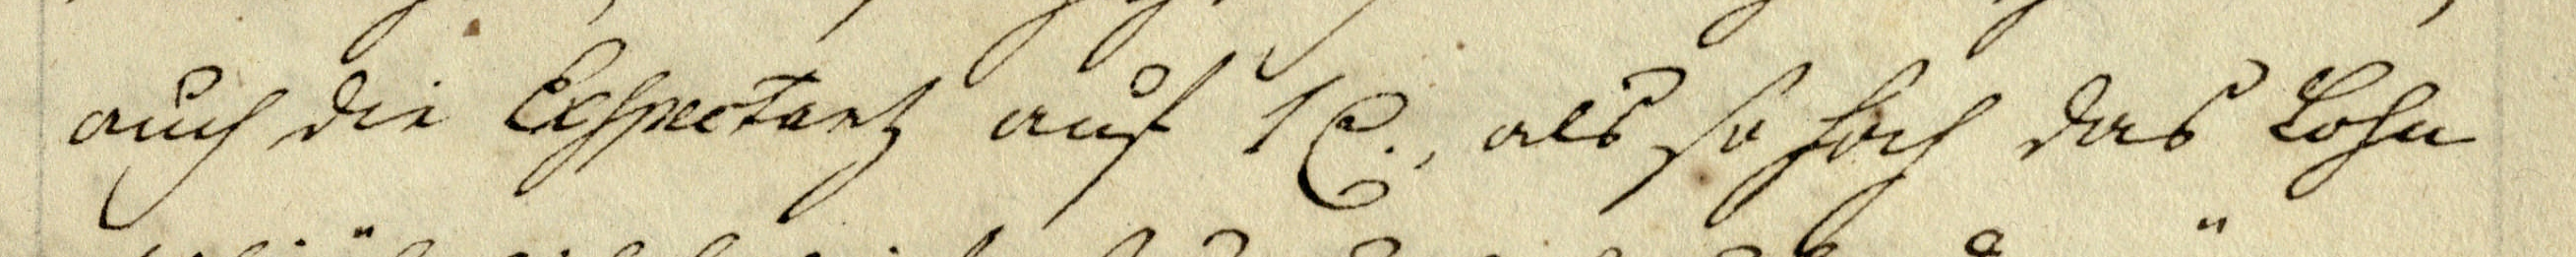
auch die Expectanz auf 1 l., als so hoch das Lohn
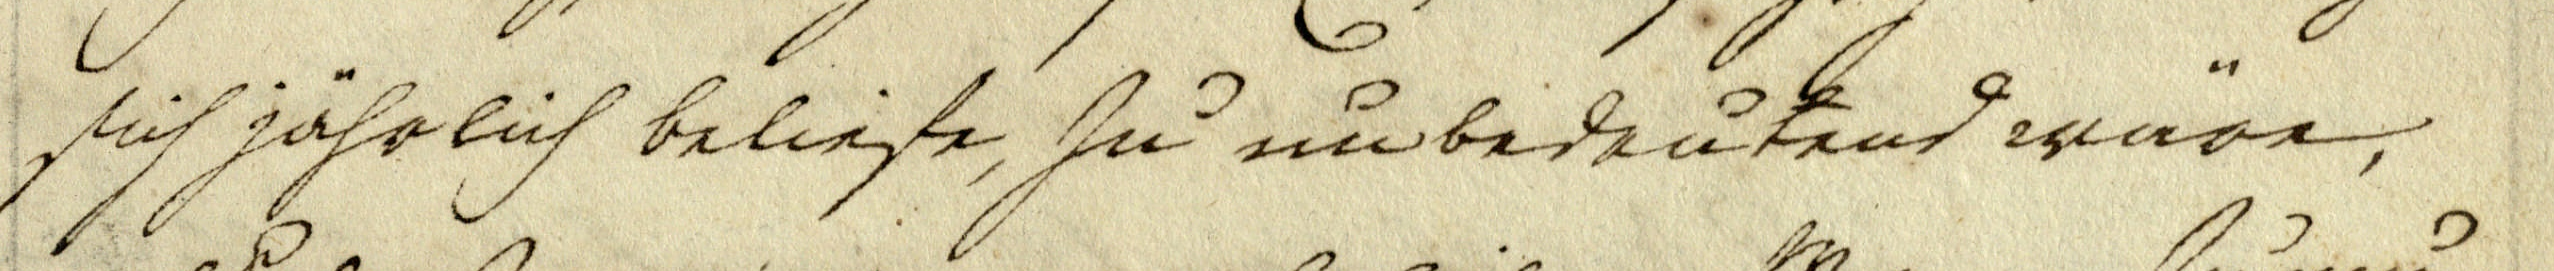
sich jährlich beliefe, zu unbedeutend wäre,
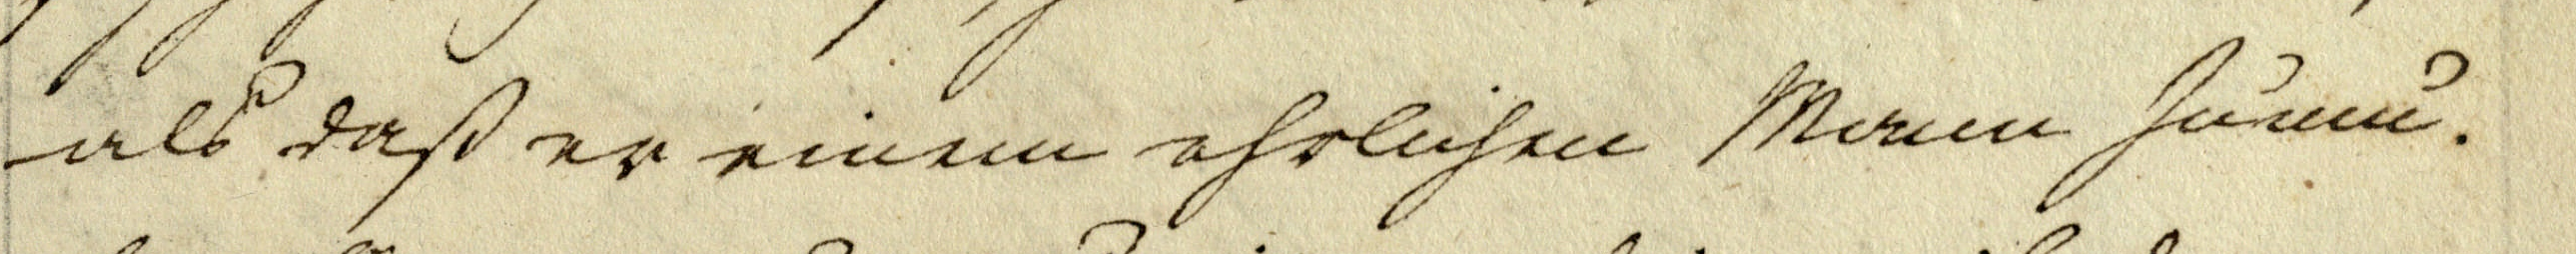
als daß er einem ehrlichen Mann zumu¬
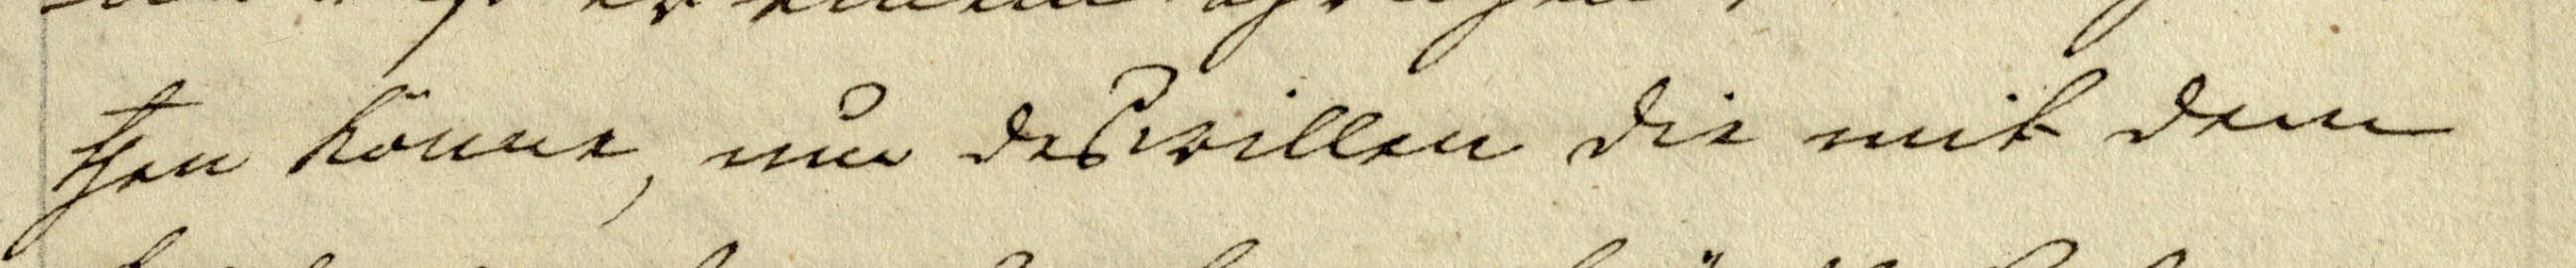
then könne und deswillen die mit dem
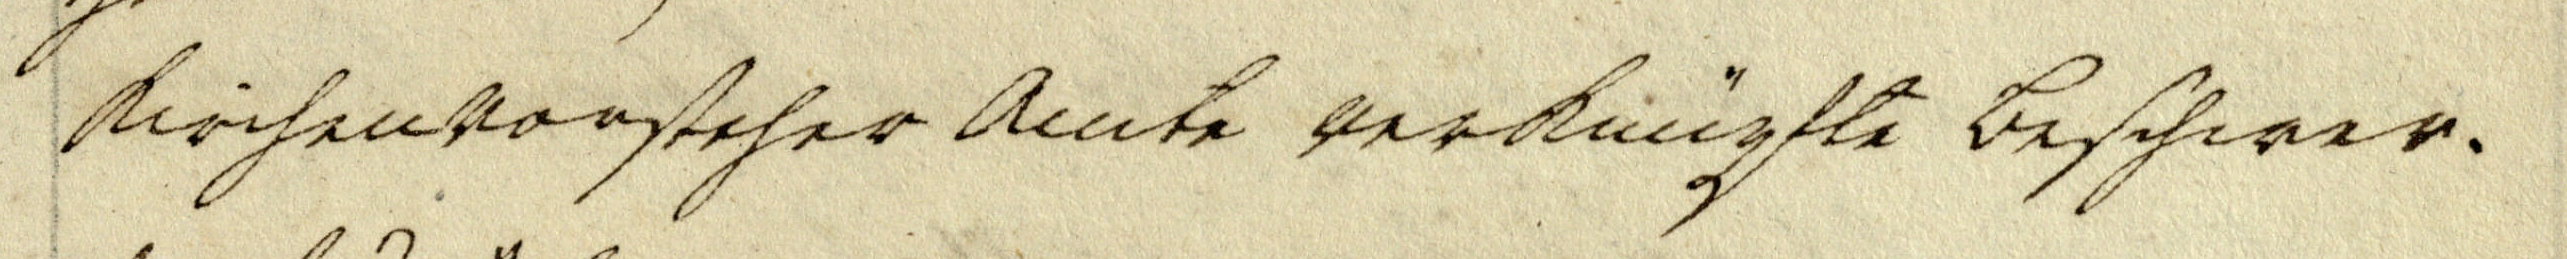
Kirchenvorsteher Amte verknüpfte Beschwer¬
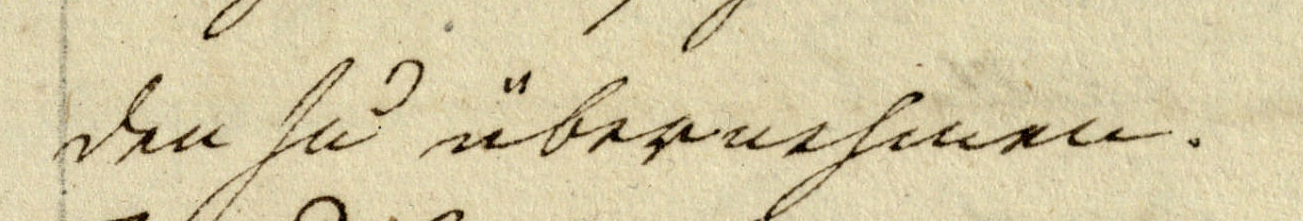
den zu übernehmen.
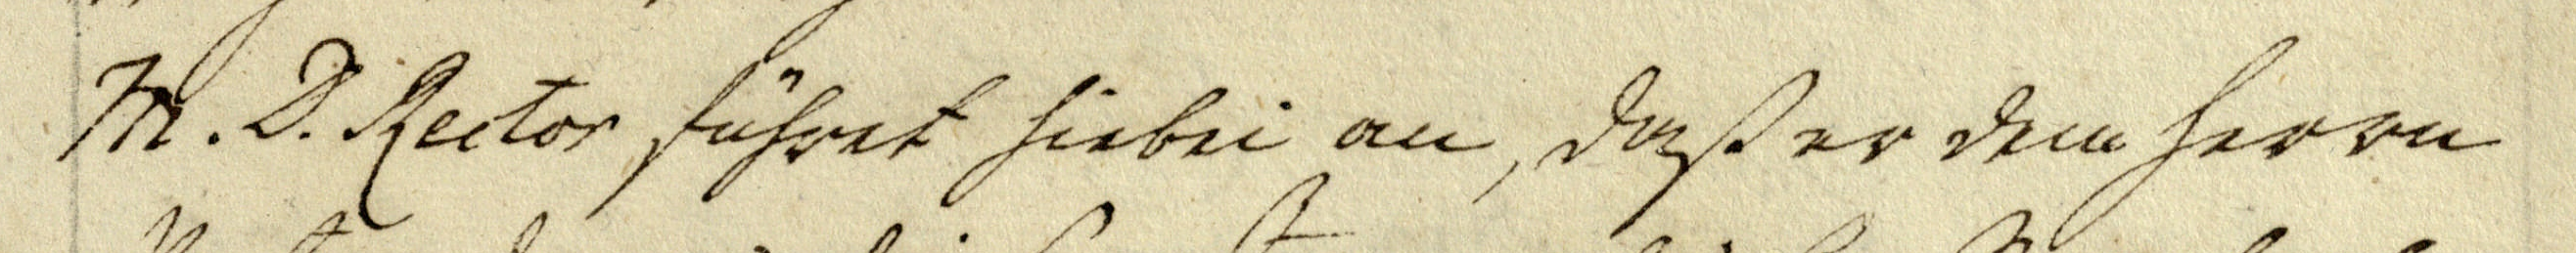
M. D. Rector führet hiebei an, daß er dem Herrn
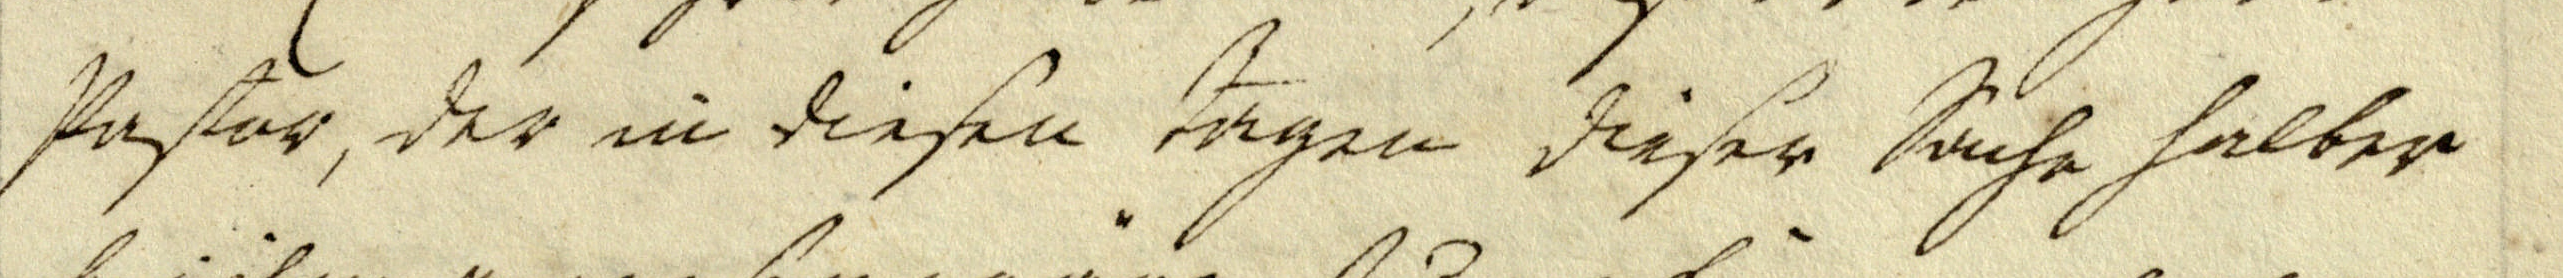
Pastor, der in diesen Tagen dieser Sache halber
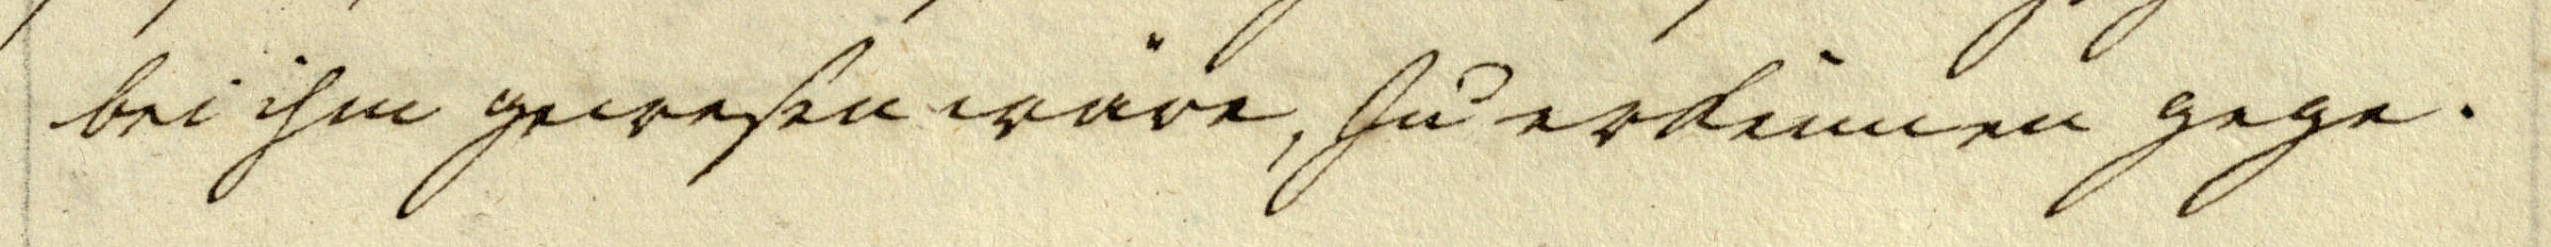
bei ihm gewesen wäre, zu erkennen gege¬
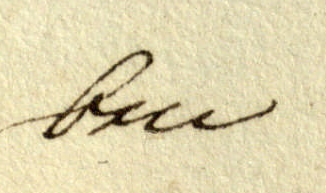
ben
